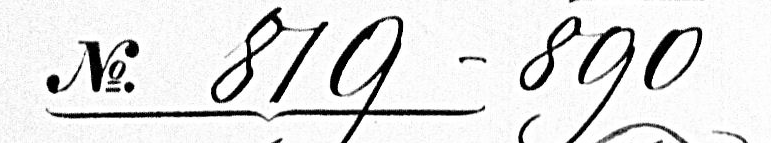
N° 819 - 890
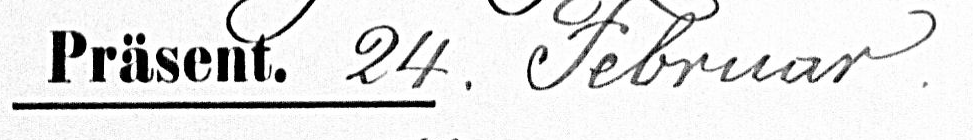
Präsent. 24. Februar.
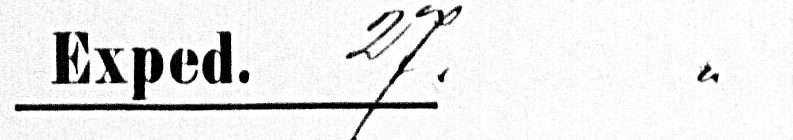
Exped. 27. Februar.
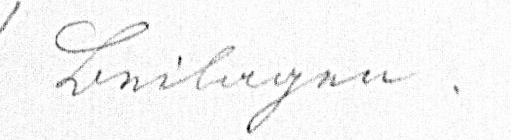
Beilagen.
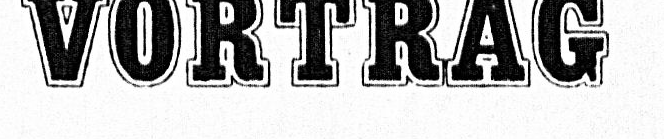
VORTRAG
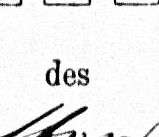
des
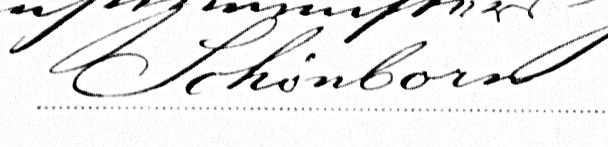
Schönborn
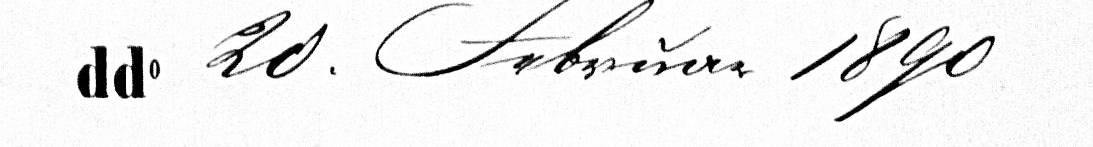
dd° 20. Februar 1890
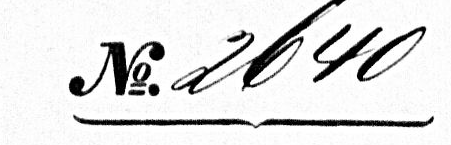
N°. 2640
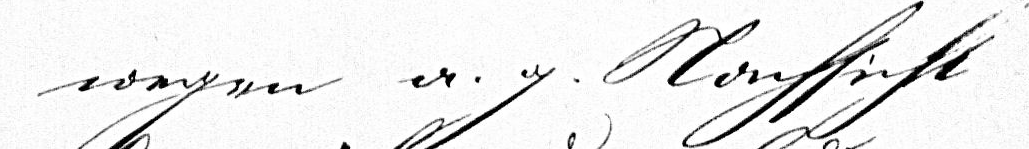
wegen a. g. Nachsicht
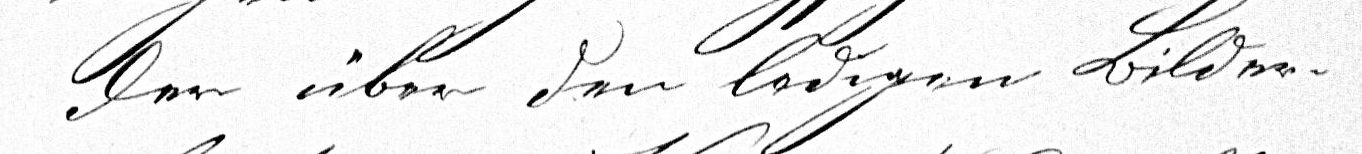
der über den ledigen Bilder¬
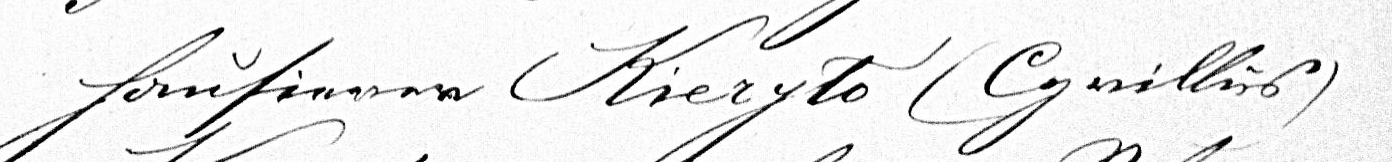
hausierer Kieryto (Cyrillus)
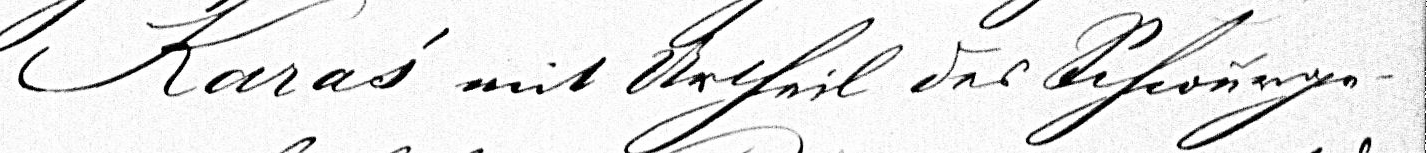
Karaś mit Urtheil des Schwurge¬
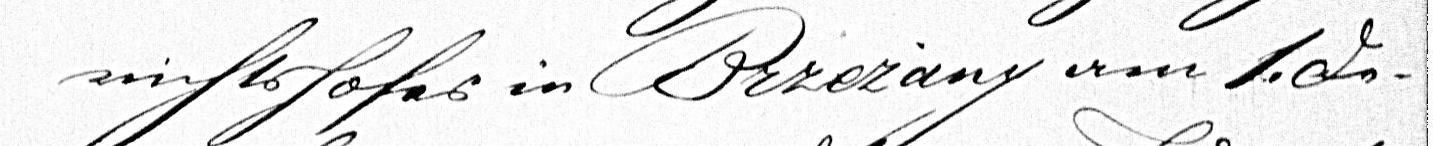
richtshofes in Brzezang am 1. De¬
